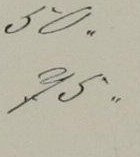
75
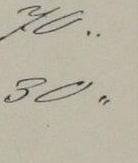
30
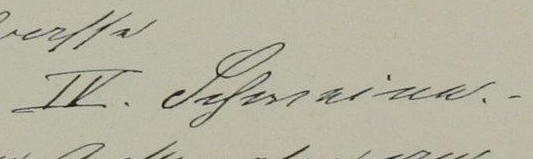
IV. Schweine
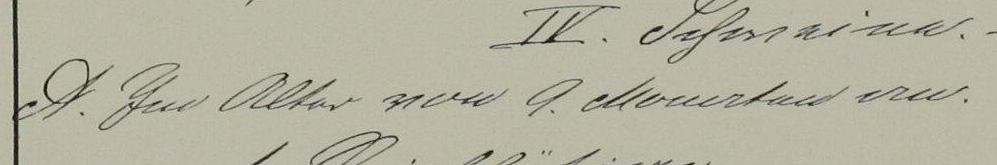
A. Im Alter von 9. Monaten an:
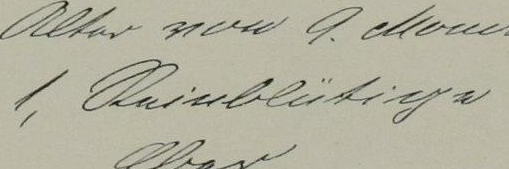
1. Reinblütige
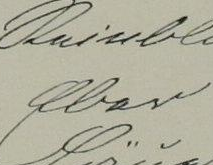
Eber
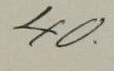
40
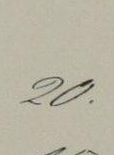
20
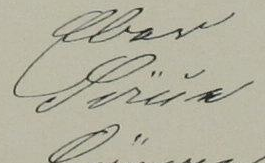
Säue
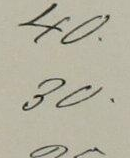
30
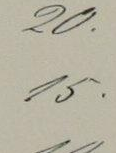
15
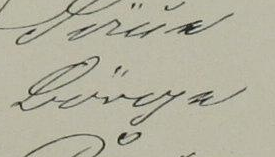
Börge
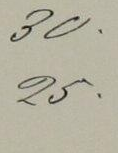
25
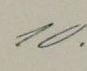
10
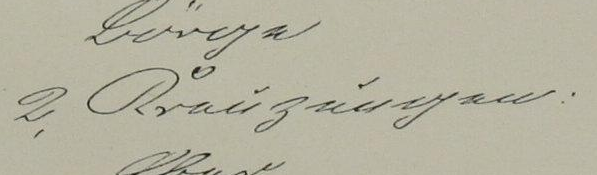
2. Kreuzungen:
